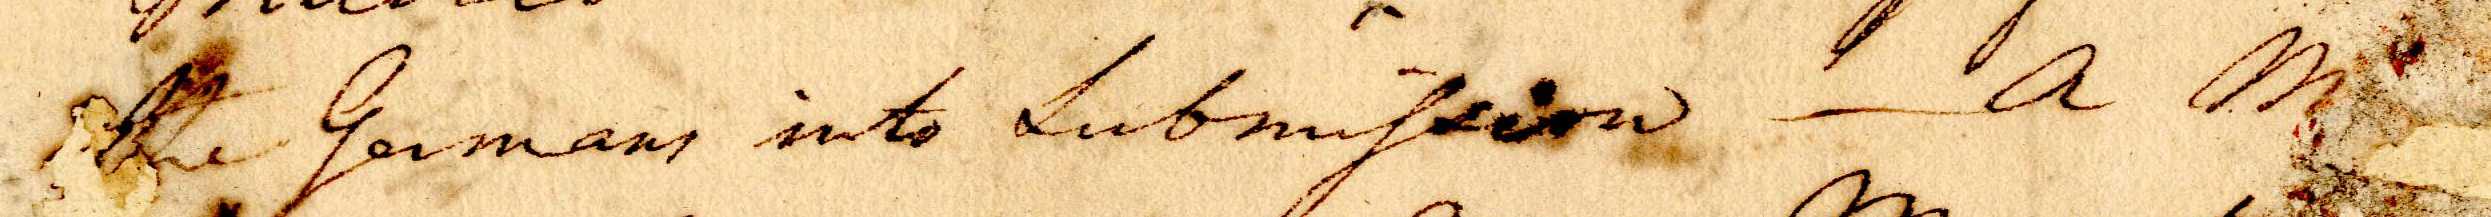the Germans into Submission- A Man
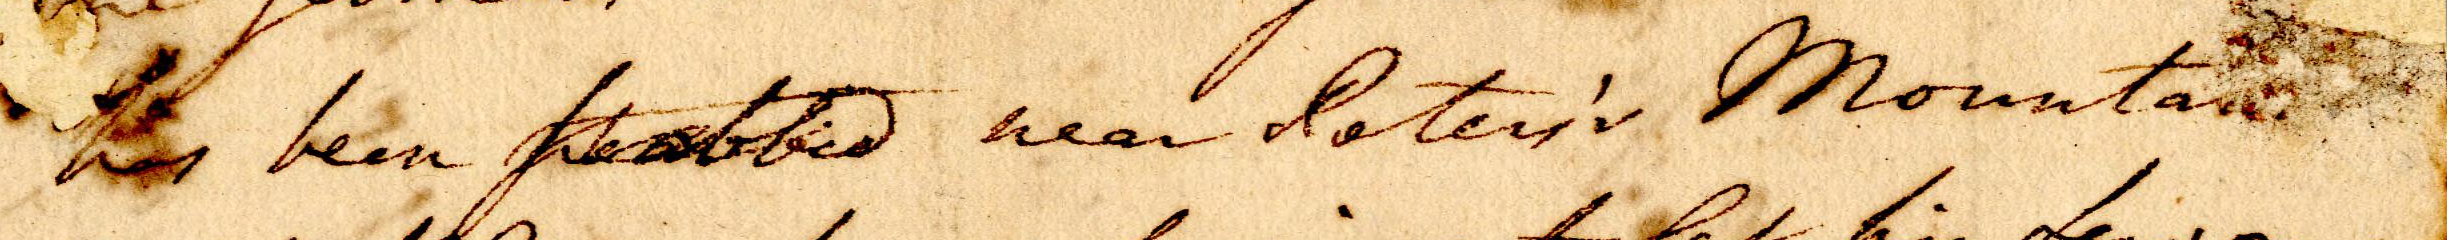has been stabbed near Peters's Mountain
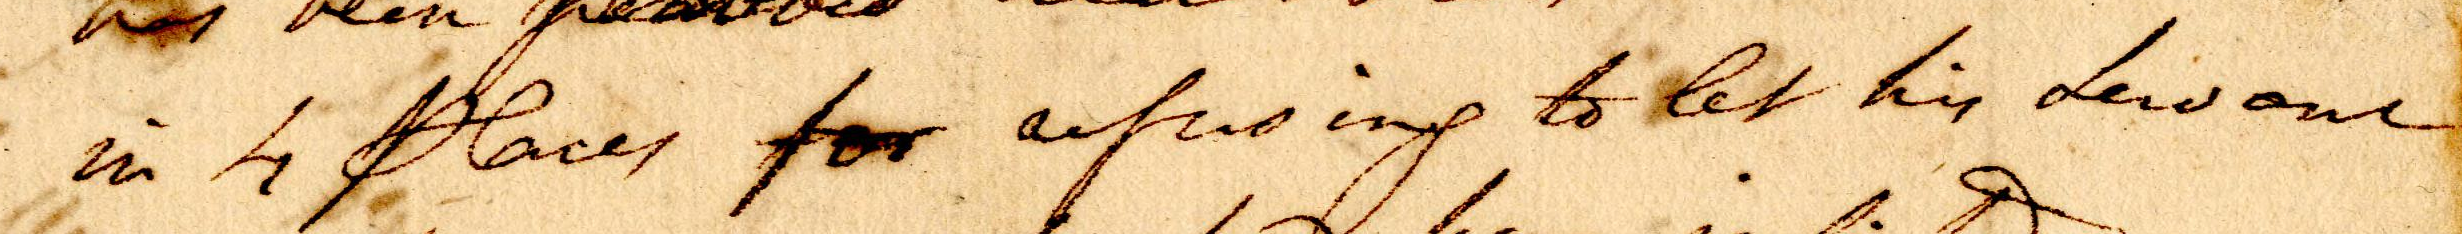in 4 Places for refusing to let his Lead out
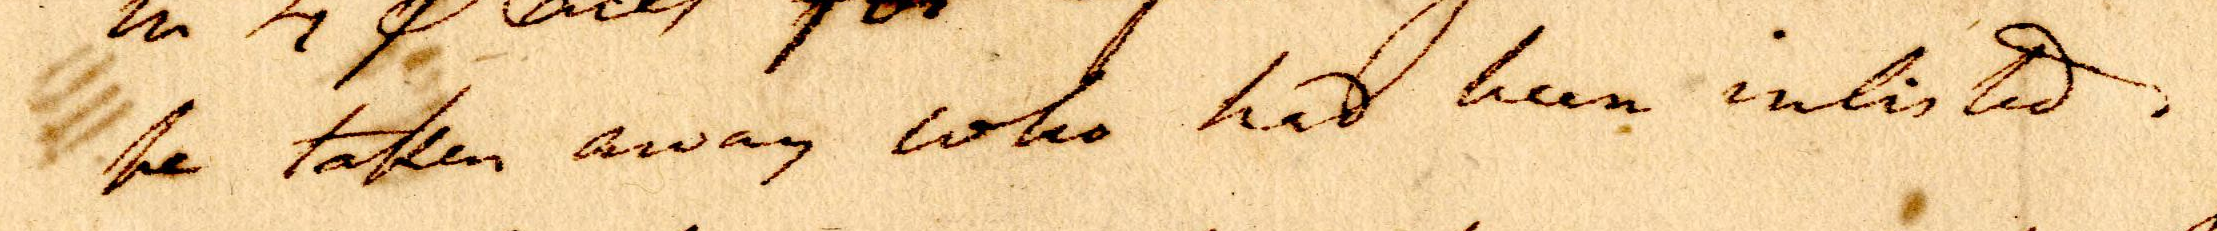be taken away who had been inlisted.
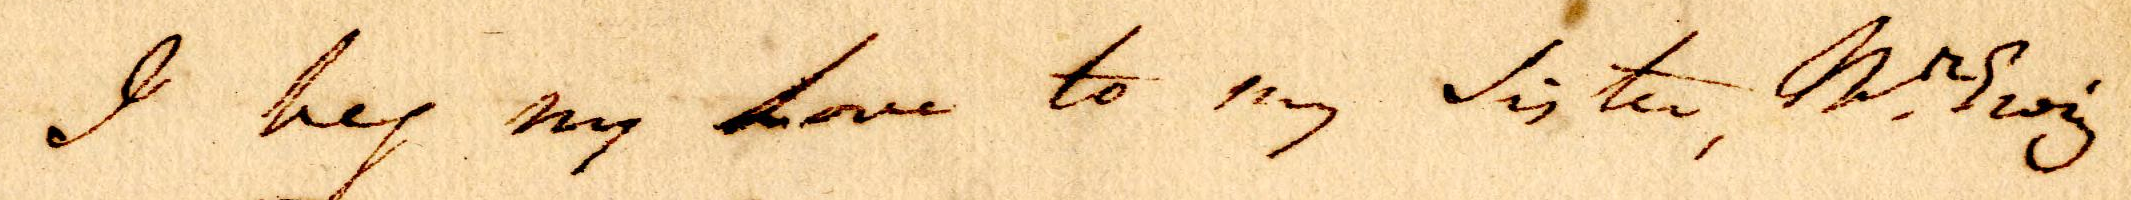I beg my Love to my Sister, M^r Ewing
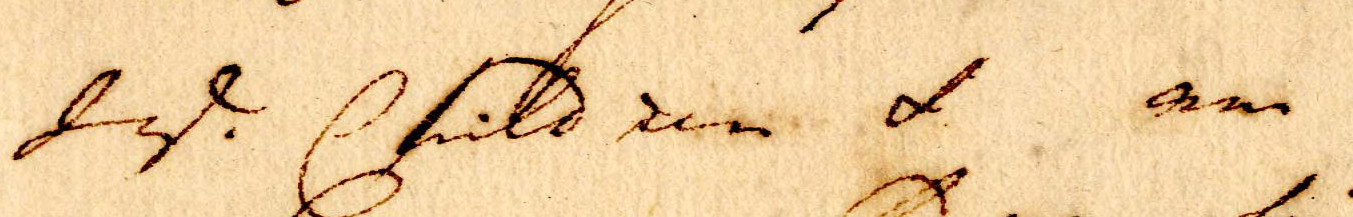& y^e Children & am
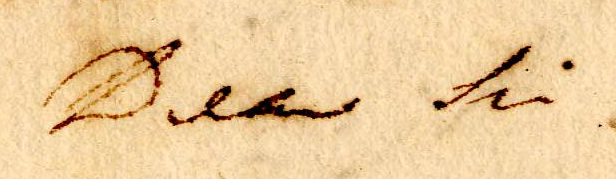Dear Sir
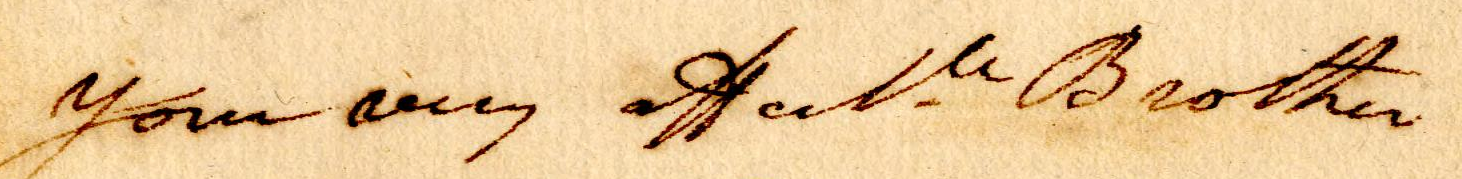your very affect^te. Brother
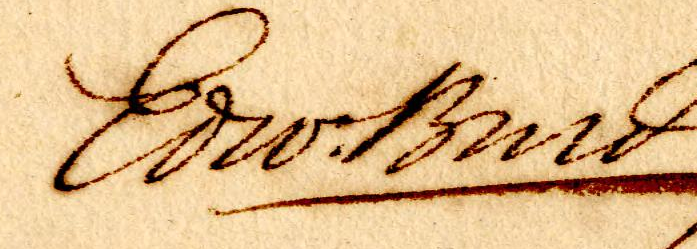Edw. Burd
